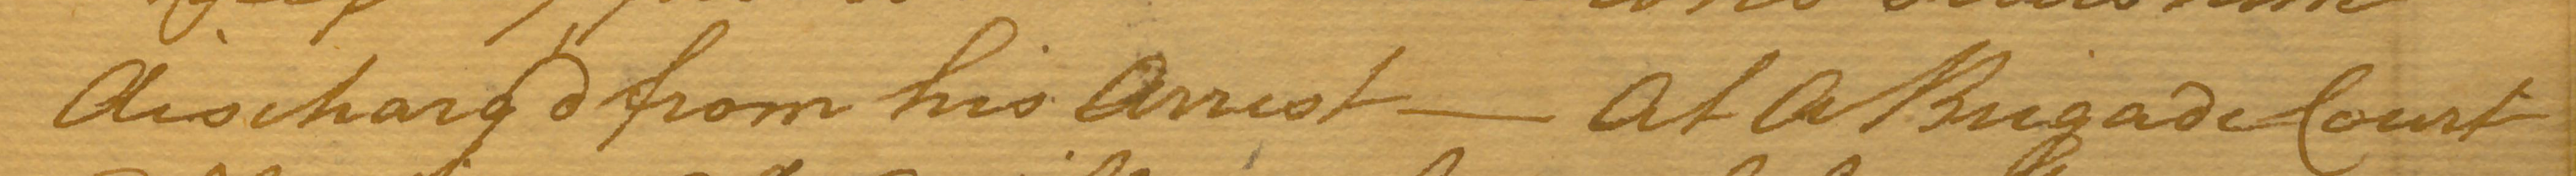discharg'd from his Arrest- At a Brigade Court
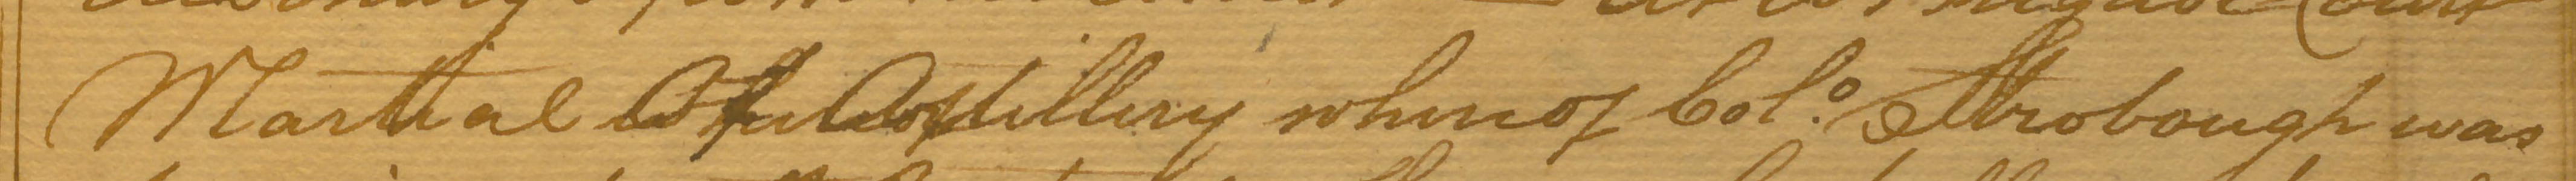Martial Of Artillery whereof Col^o. Strobough was
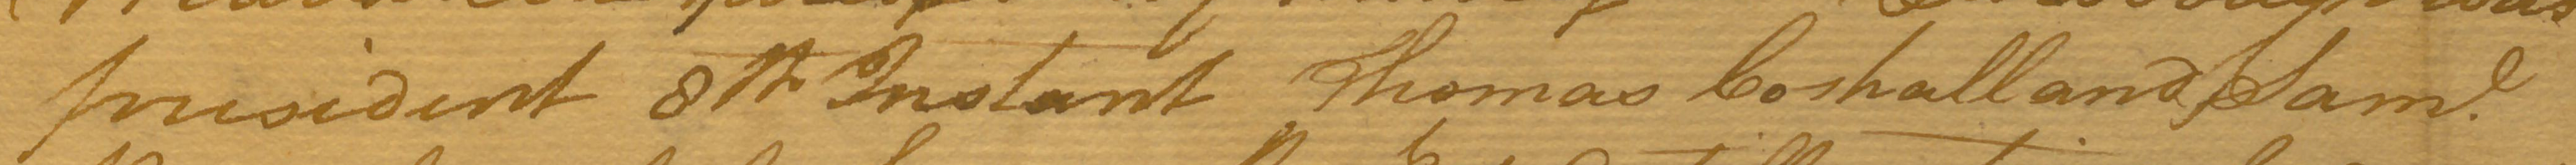president 8^th Instant Thomas Coshall and Sam^l.
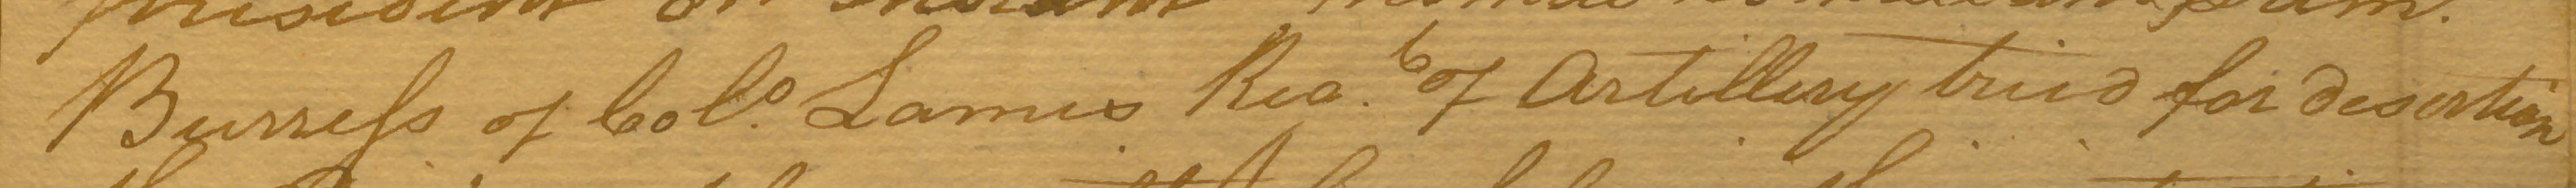Burress of Col^o. Lames Reg^t. of Artillery tried for desertion
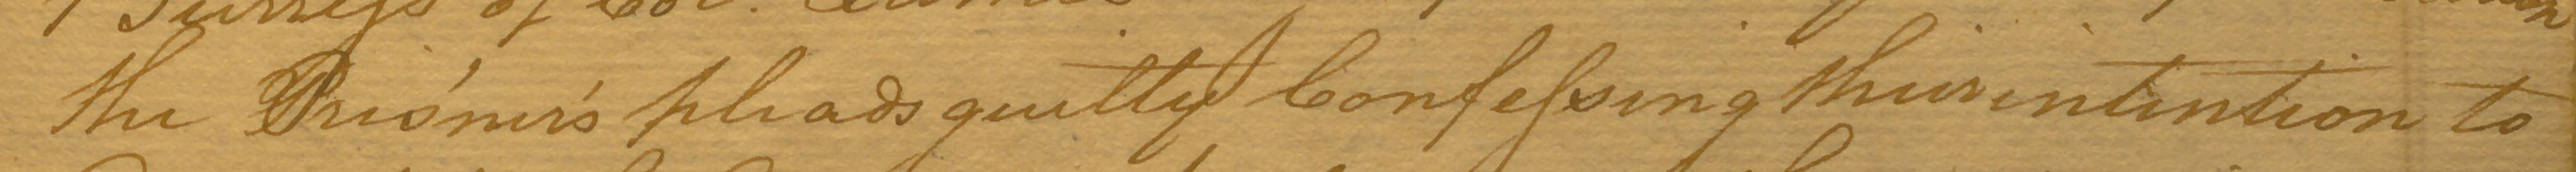the Pris'ners' pleads guilty Confessing their intention to
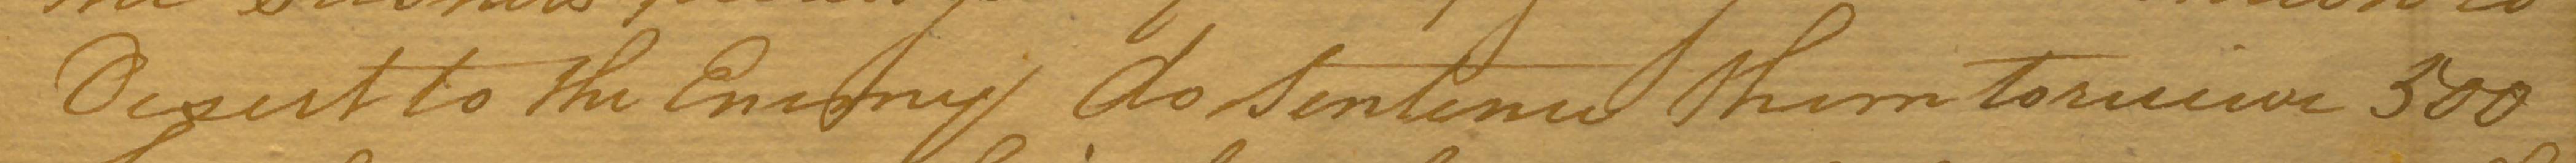desert to the Enemy do sentence them to receive 300
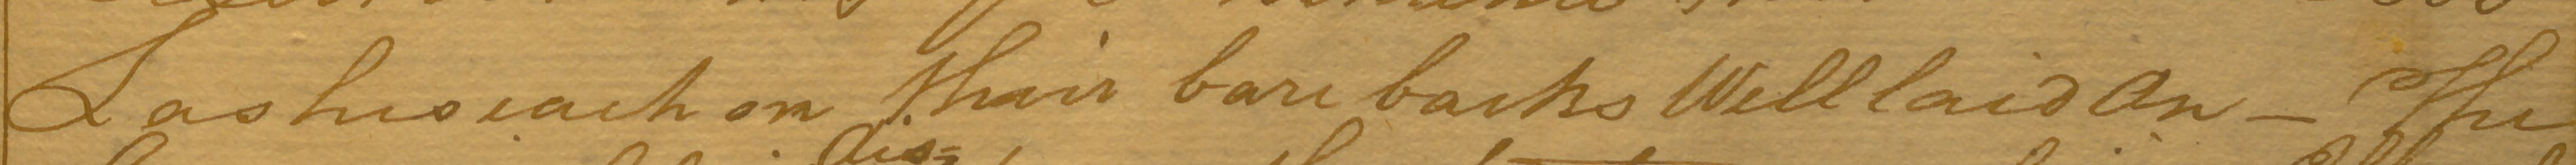Lashes each on their bare backs well laid on- The
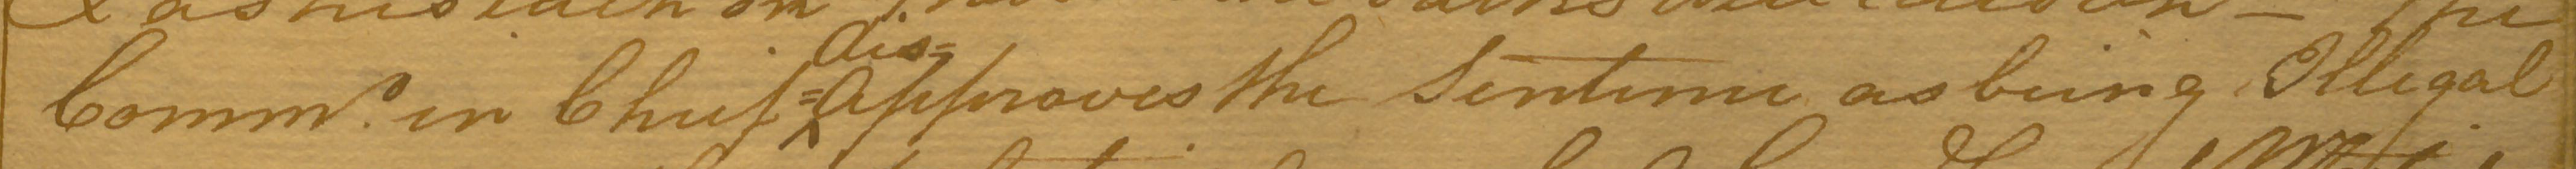Comm^r. in Chief ^dis-approves the sentence as being Illegal
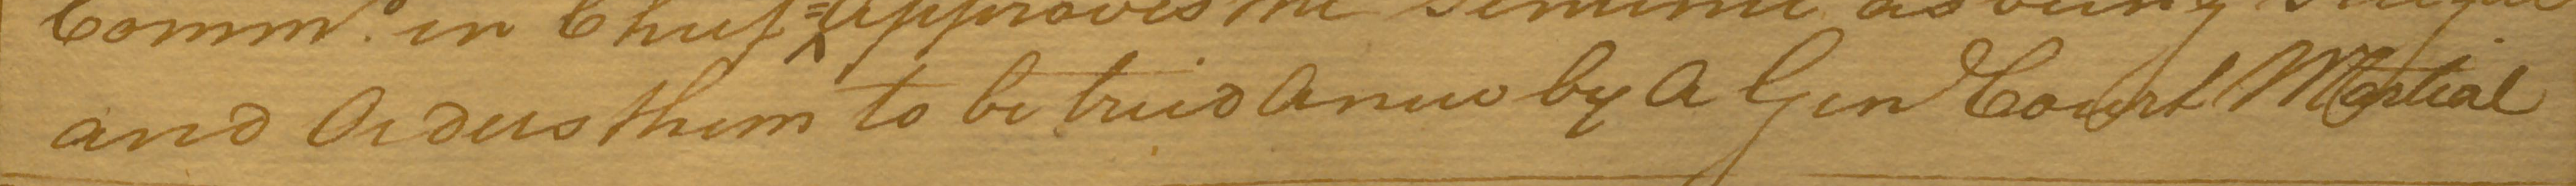and Orders them to be tried anew by a Gen^l court Martial
